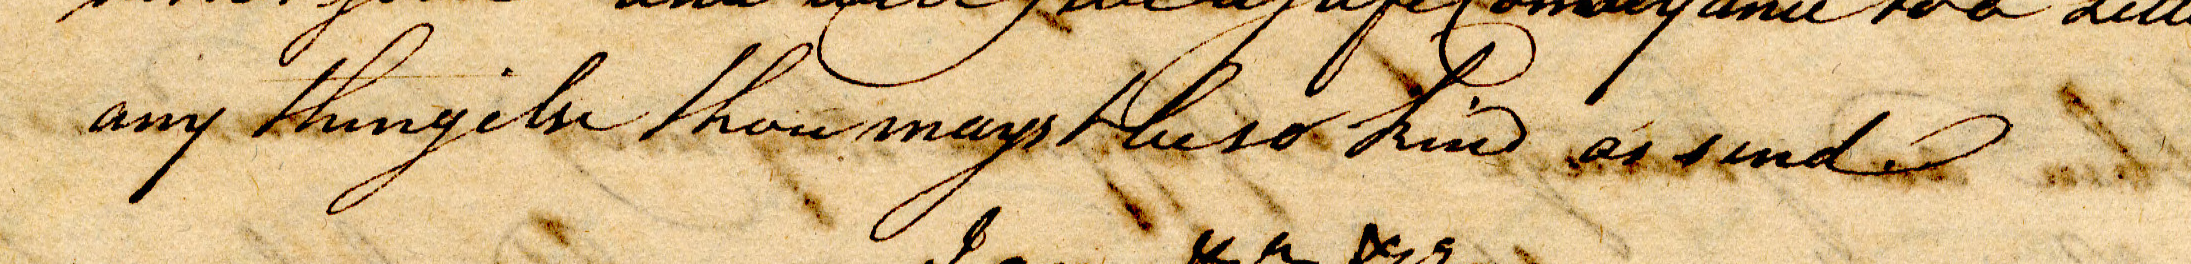any thing else thou mayst be so kind as send
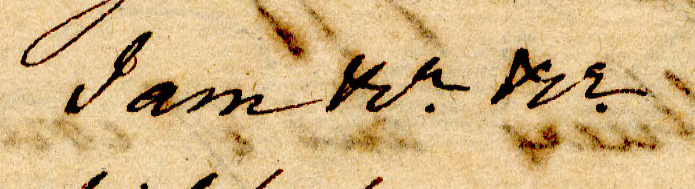I am &c^a. &c^a.
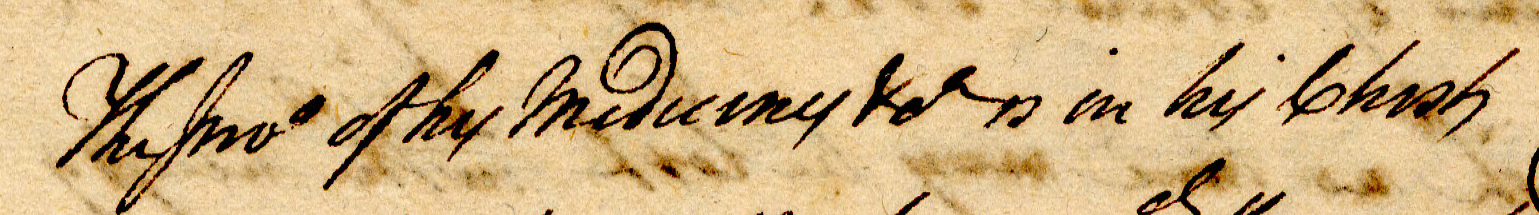The Inv^o. of his Medicines &c^a in his Chest
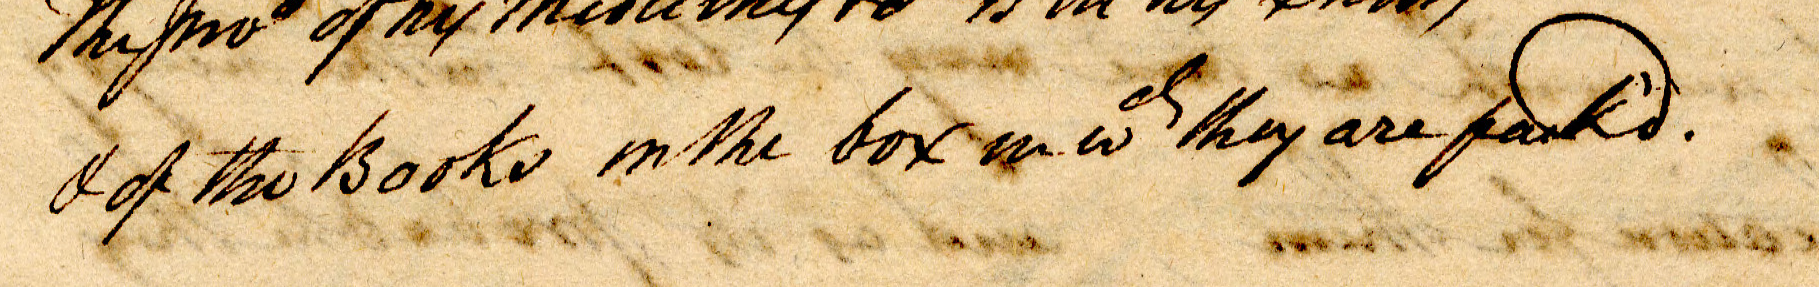& of the Books in the box in w^ch they are pack'd.
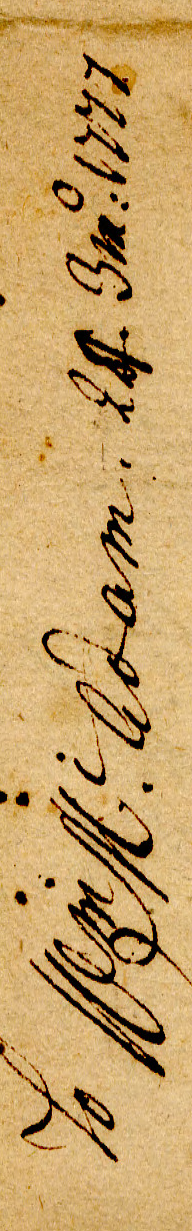To W^m M^cAdam 24. 3m^o 1777
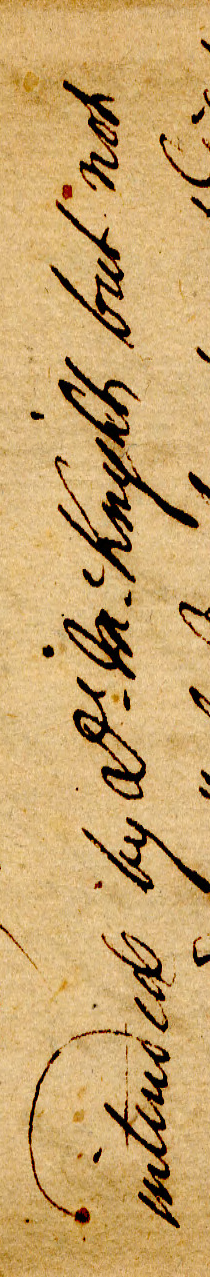intended by D^r. M^c.Knight but not
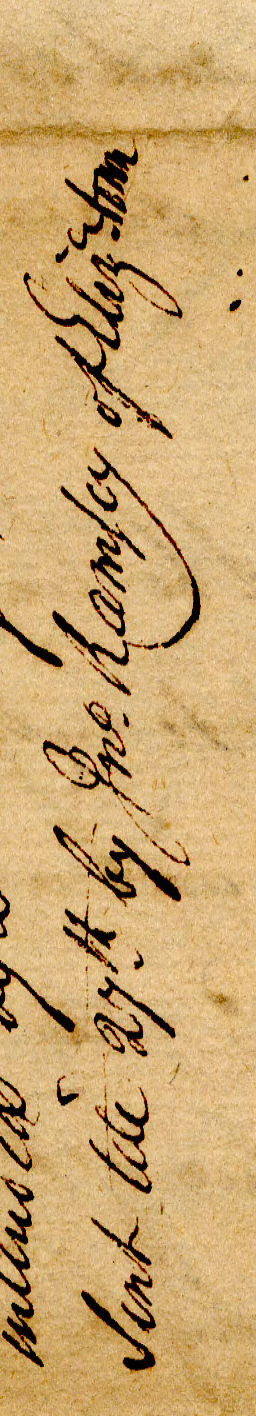sent till 27^th. by Jn^o. Ramsey of Eliz^a.town
